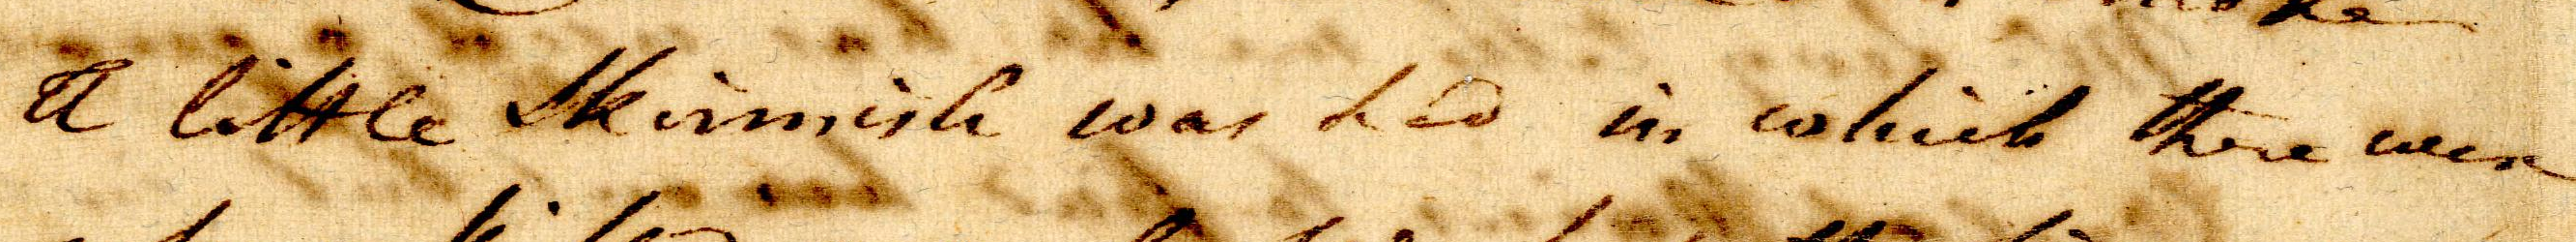A little Skirmish was led in which there were
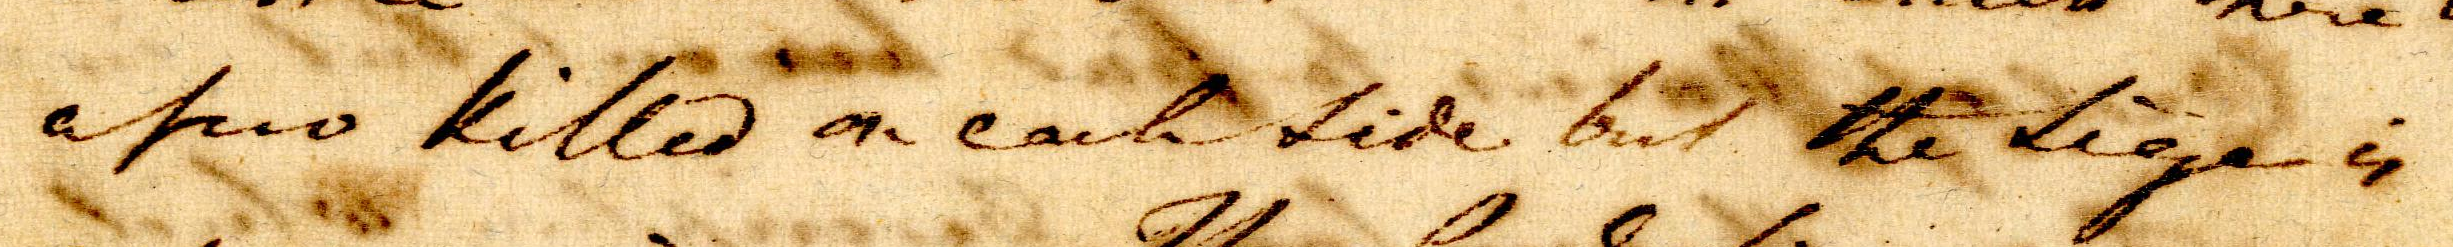a few killed on each side but the Siege is
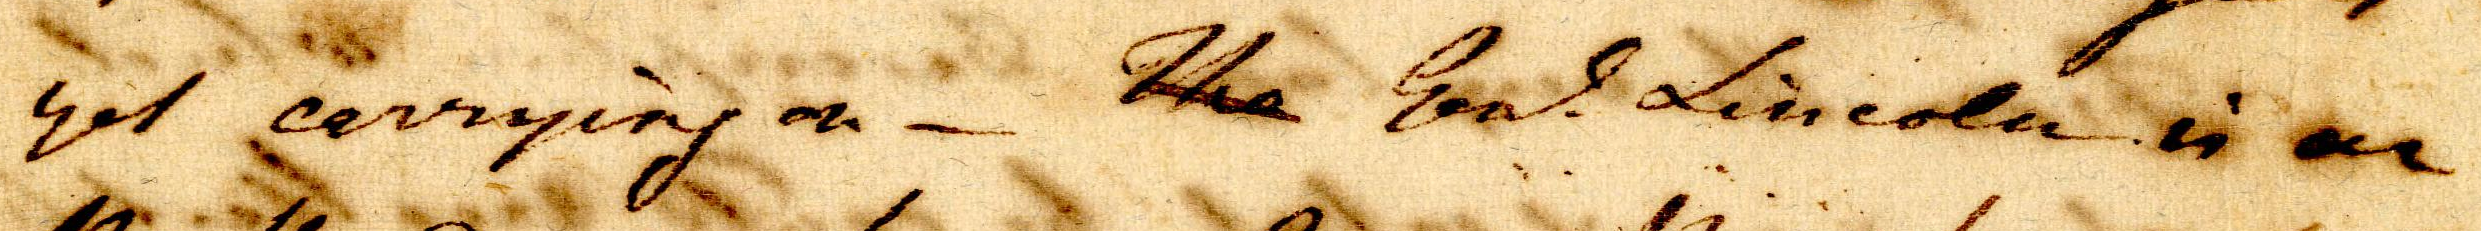yet carrying on. The Gen^l. Lincoln is on
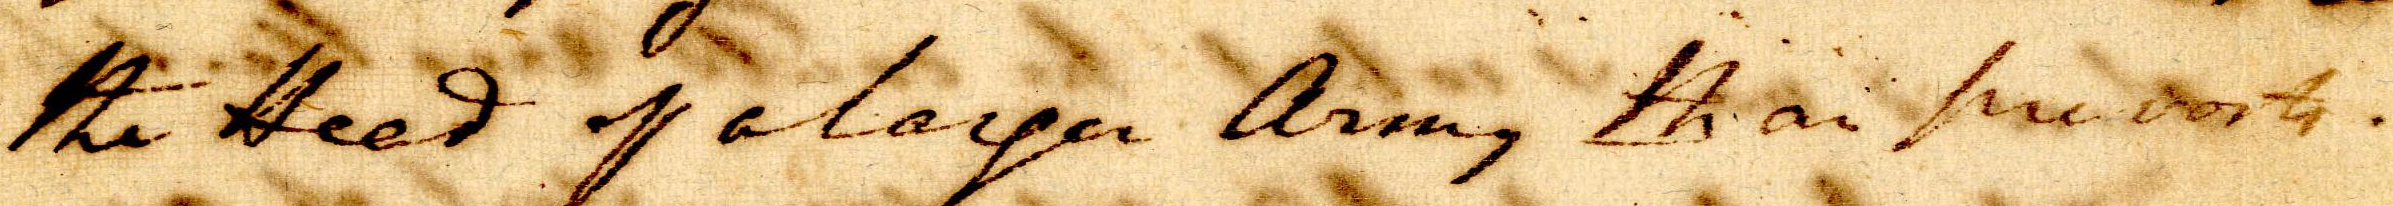the Head of a larger Army that prevents
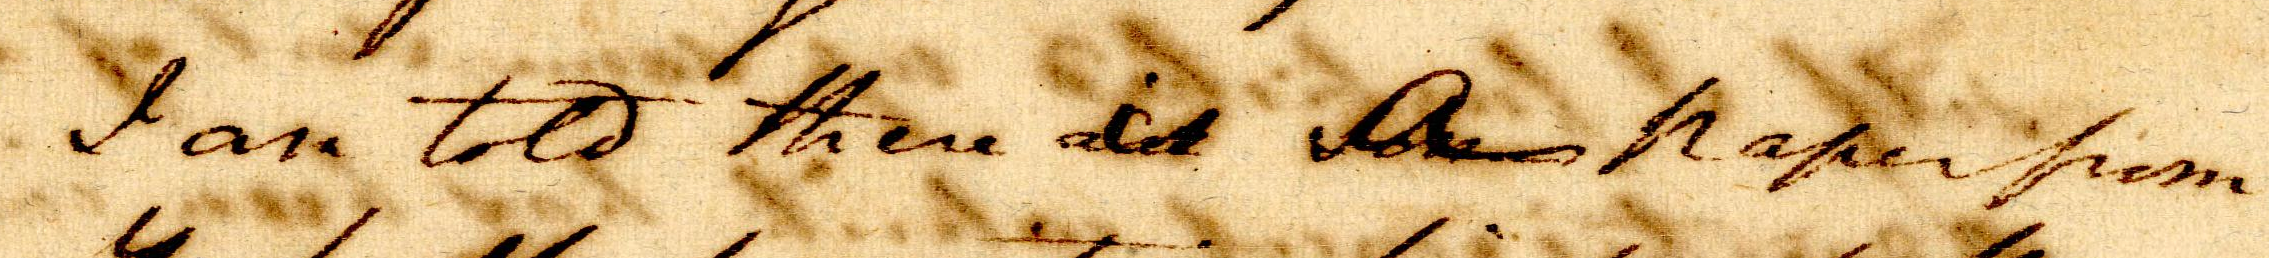I am told there is a Paper from
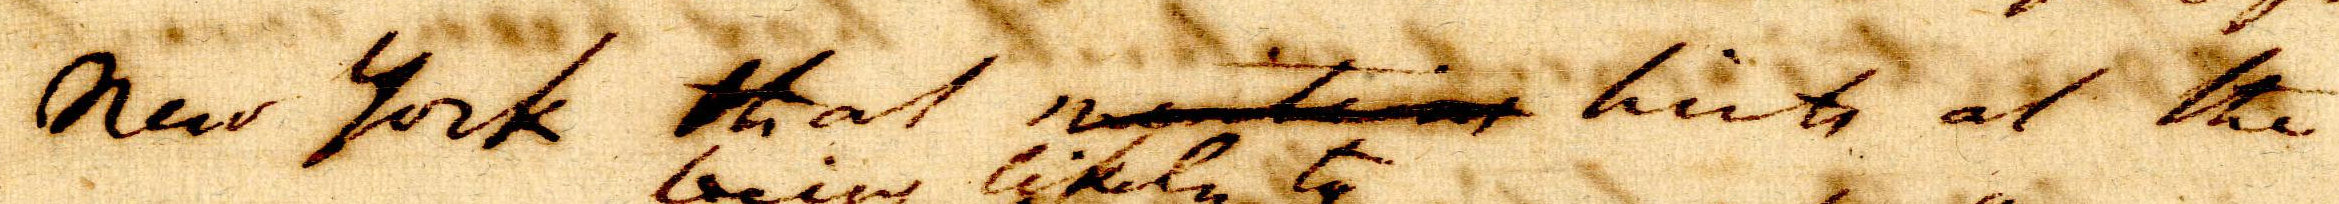New York that [_____] hints at the
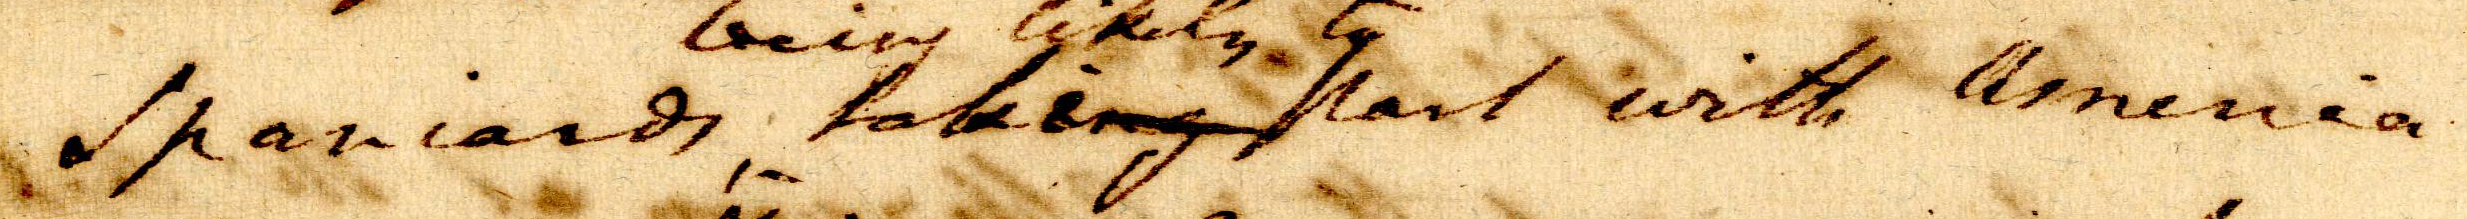Spaniards ^ taking part with America
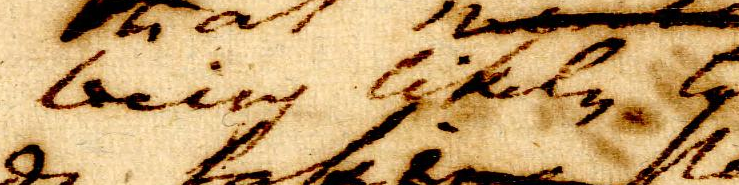being likely
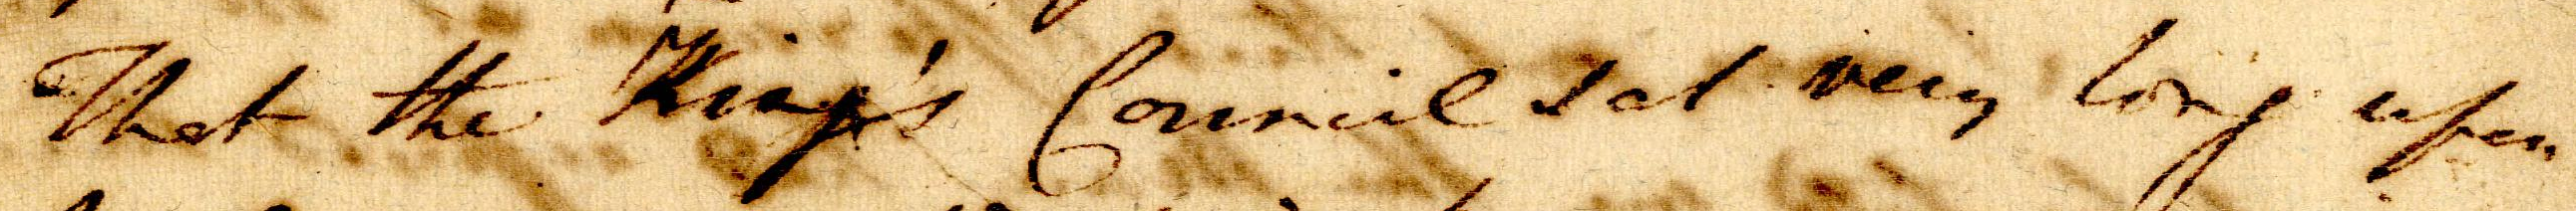That the King's Council sat very long upon
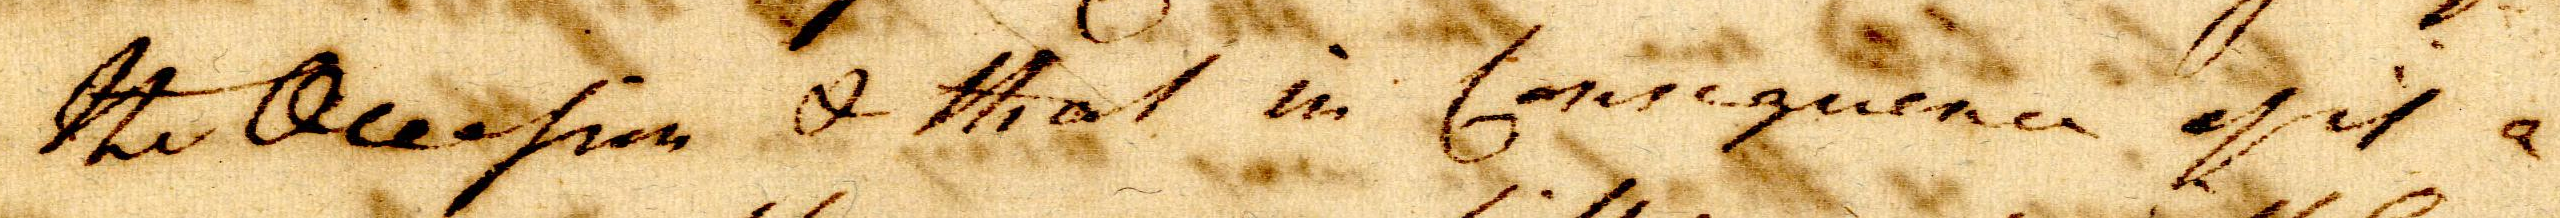the Occasion & that in Consequence of is a
